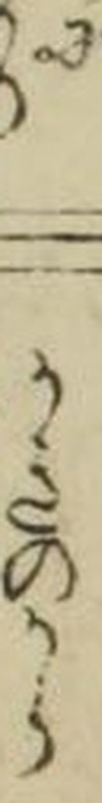かきのから
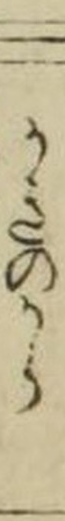かきのから
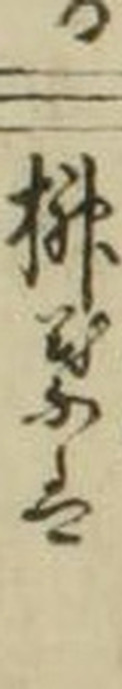榊葉は
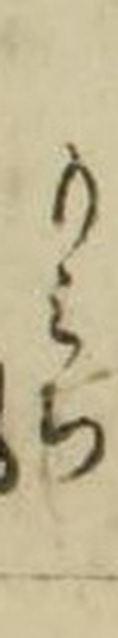もみぢ
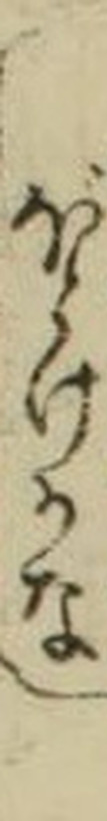ぼとけかな
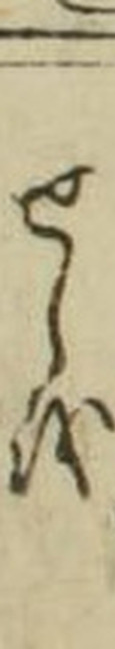せしを
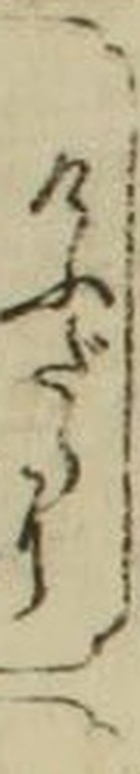けふだらに
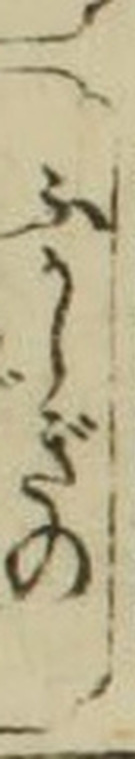ふかしぎの
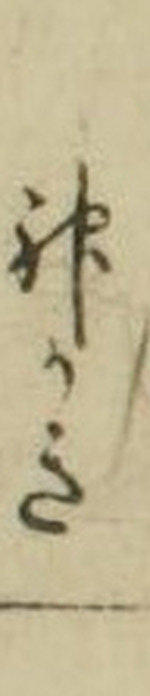神かき
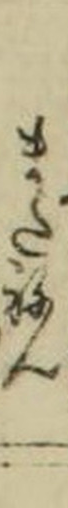またねん
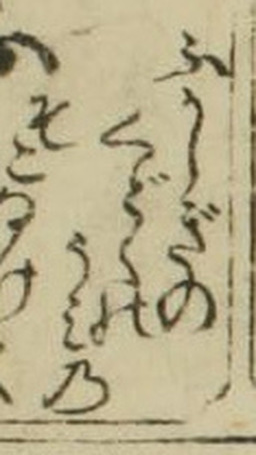くどくの
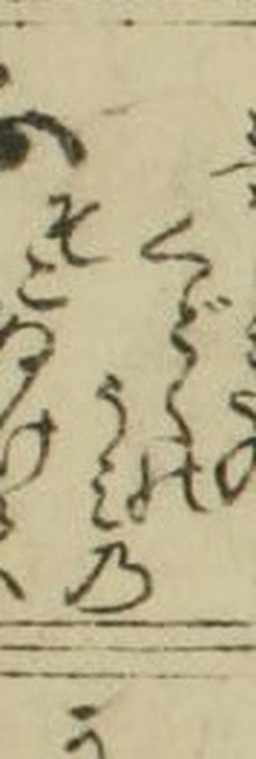そこぬけて
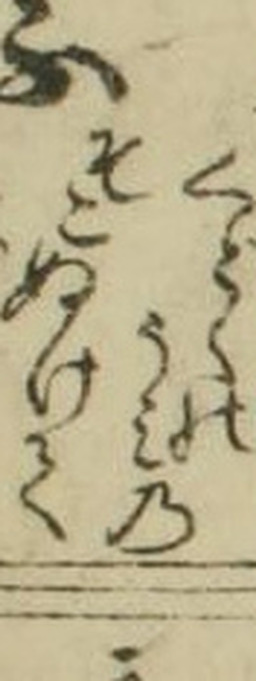そこぬけて
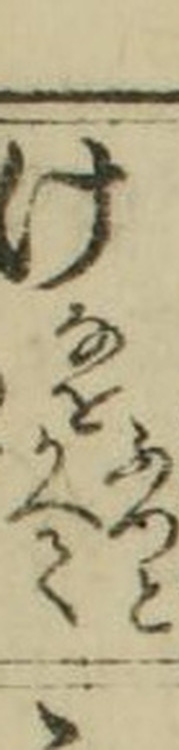なをかへて
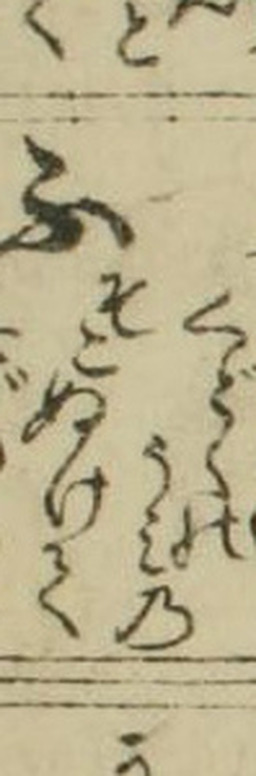そこぬけて
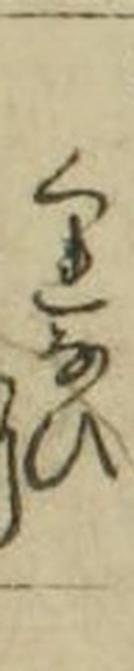くれなひ
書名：女源氏教訓鑑
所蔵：東京学芸大学附属図書館
